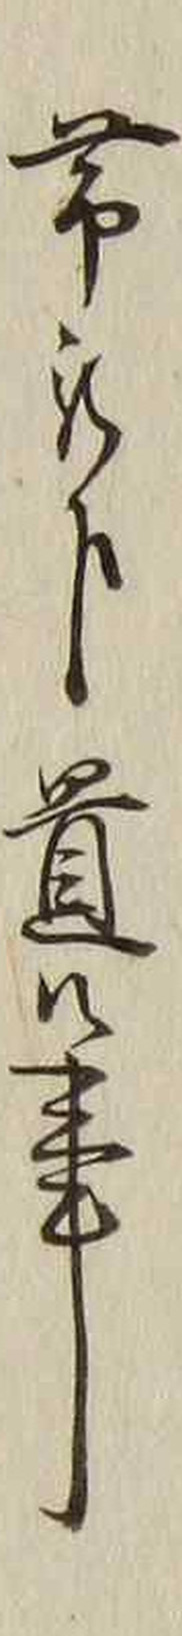帯被下置候事
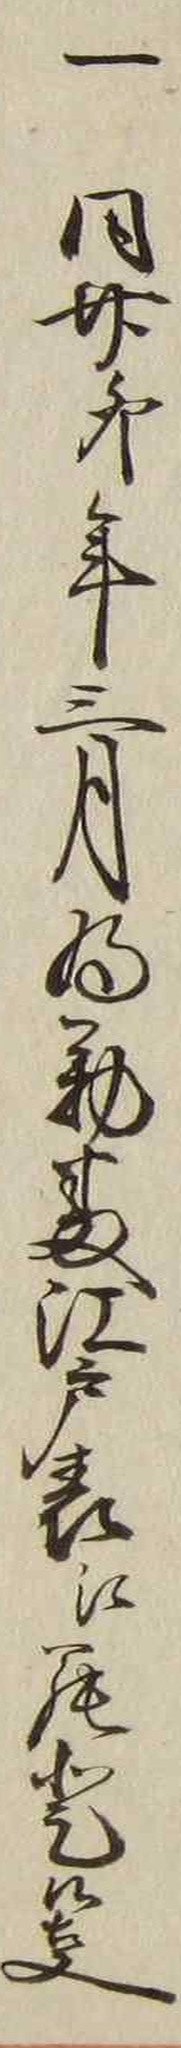一同廿卯年三月為勤番江戸表へ罷登候事

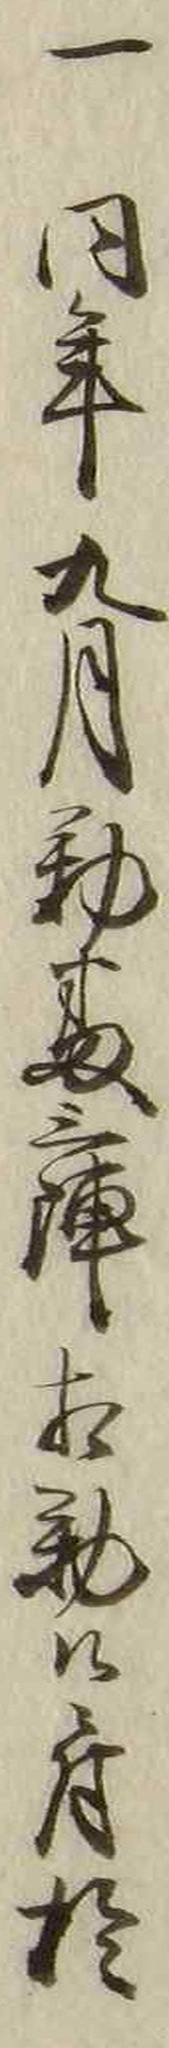一同年九月勤番三陣相勤候に付於
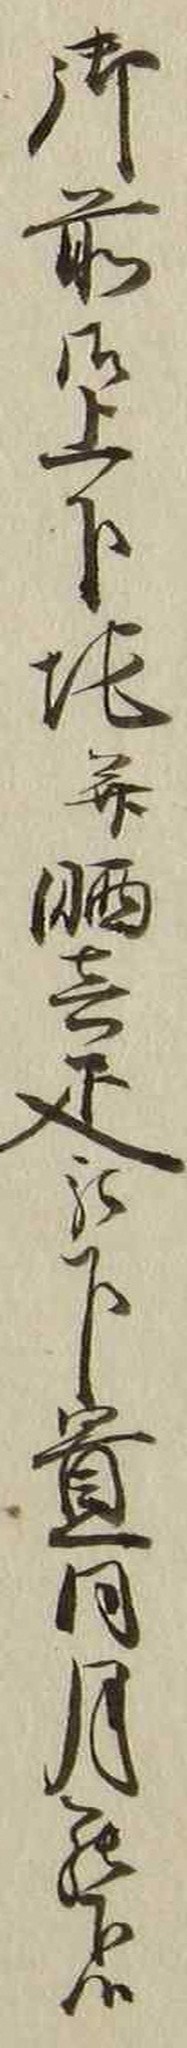御前御上下地并晒壱疋被下置同月罷下候
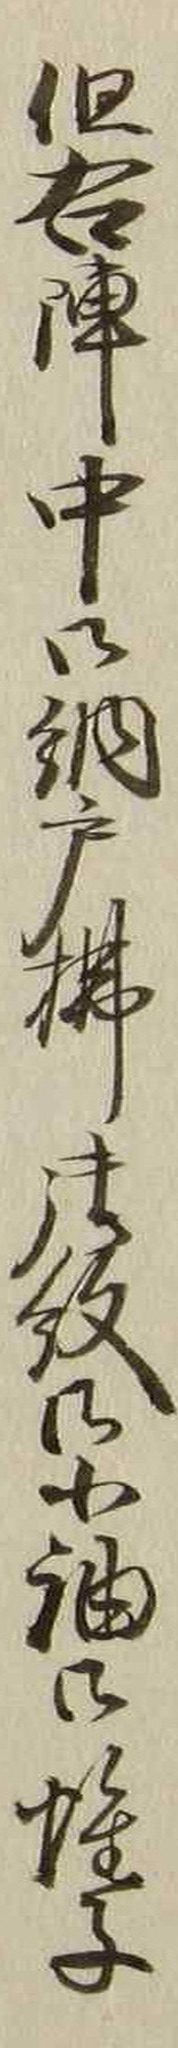但右陣中御納戸払御紋御小袖御帷子
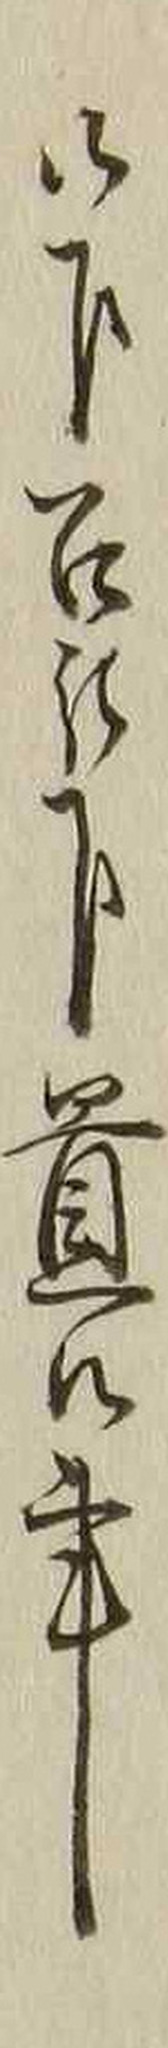御下召被下置候事
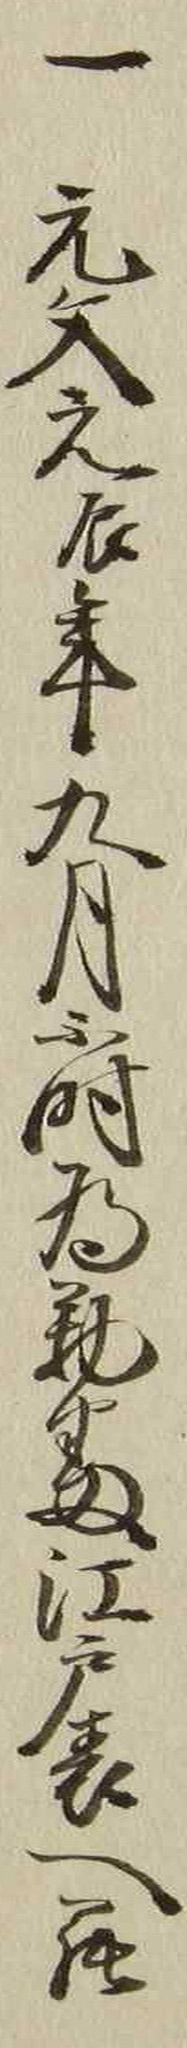一元文元辰年九月不時為勤番江戸表へ罷
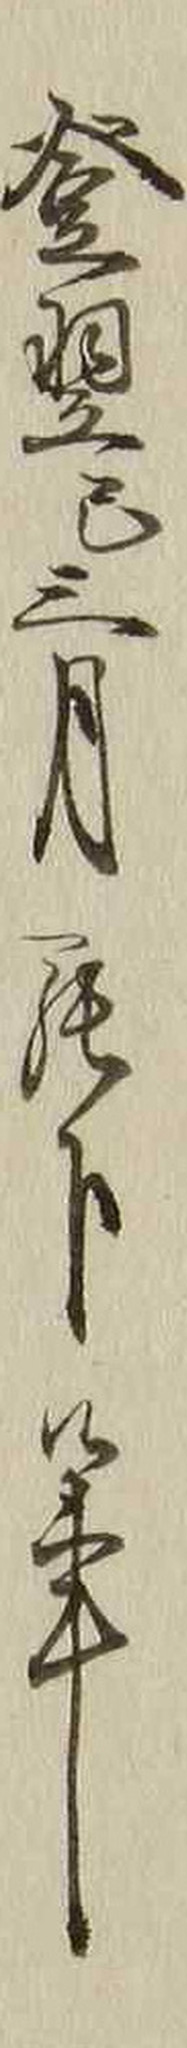登翌巳三月罷下候事
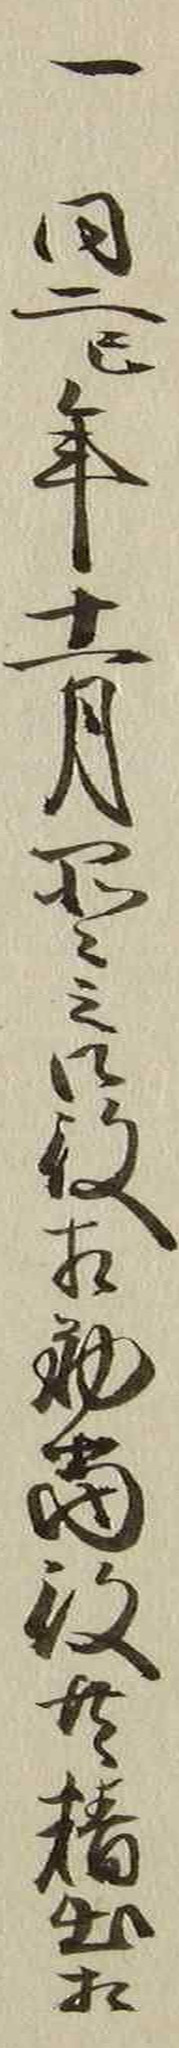一同二巳年十一月品々御役相勤当役共精出相
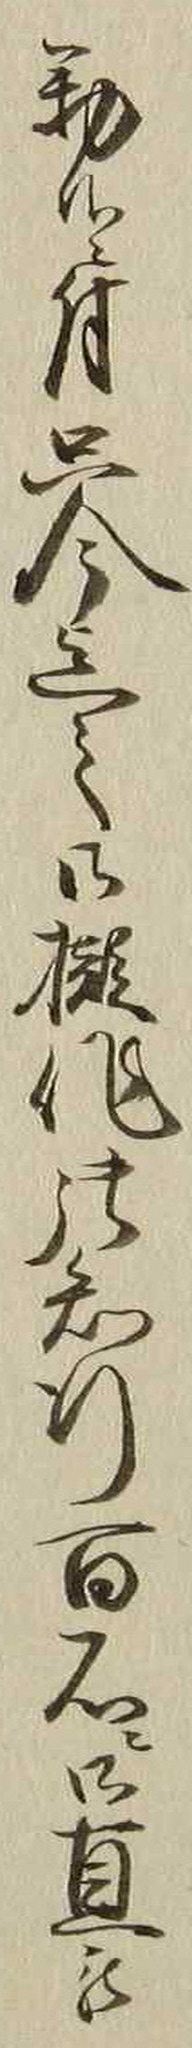勤候に付只今迄之御擬作御知行百石に御直被
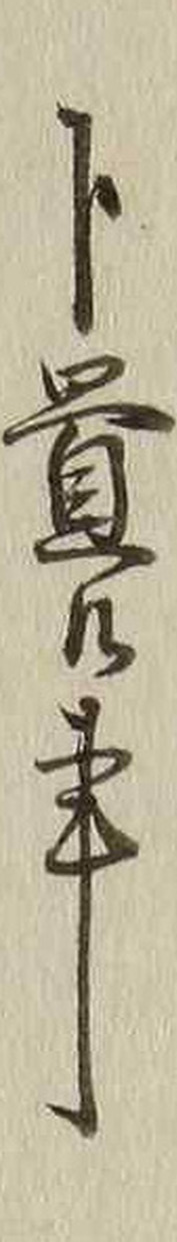下置候事
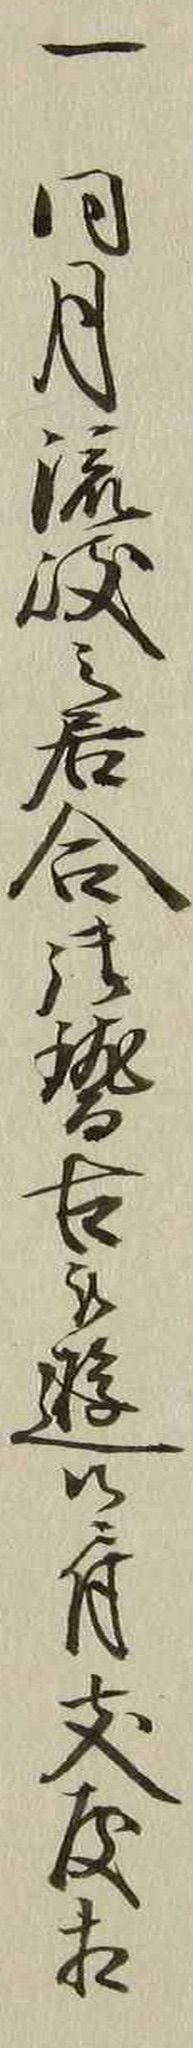一同月流岐之居合御稽古被遊候に付支度相
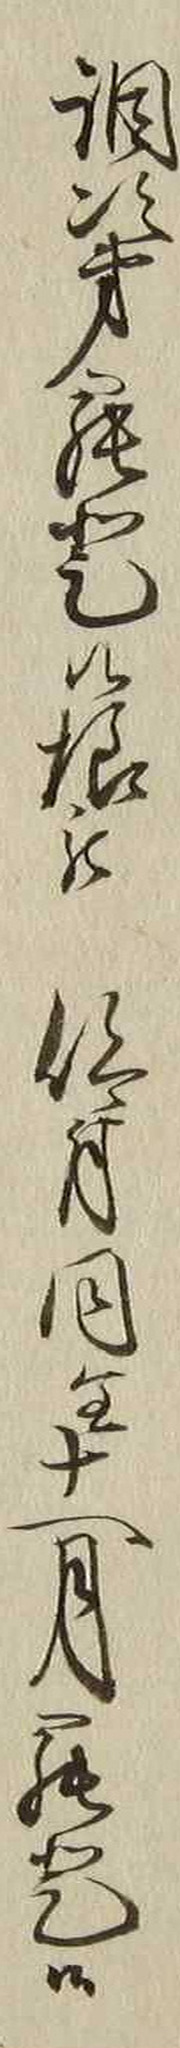調次第罷登侯様被仰付同閏十一月罷登候
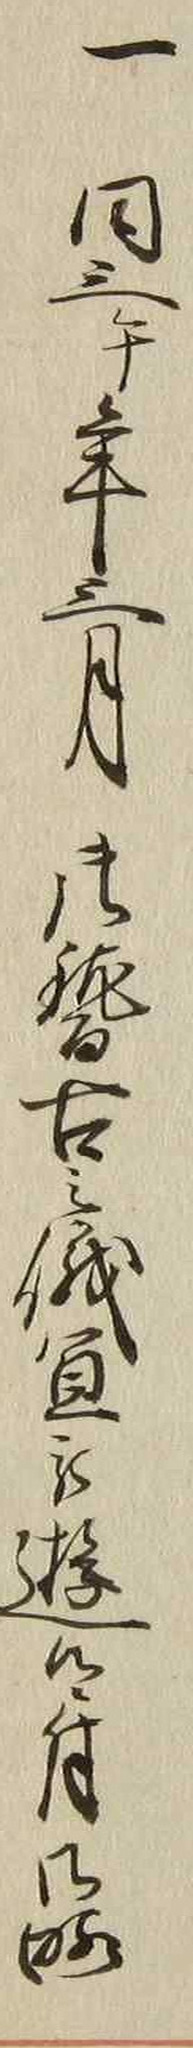一同三午年三月御稽古之儀宜被遊候に付御暇
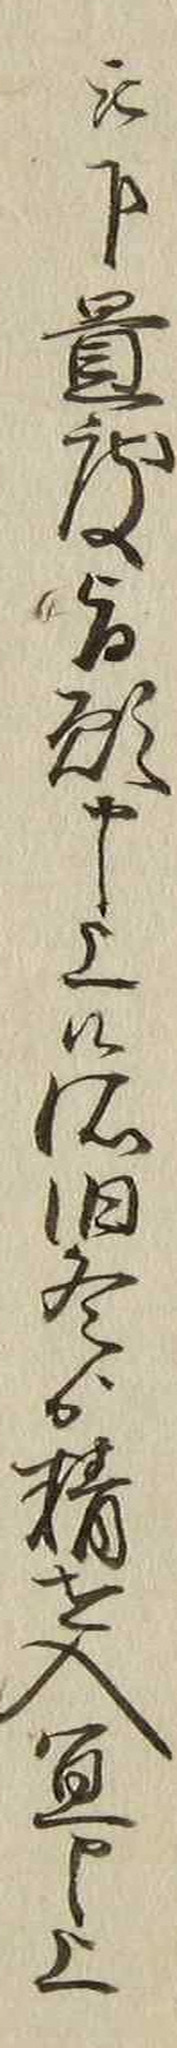被下置度旨願申上侯所旧冬ゟ精を入宜申上
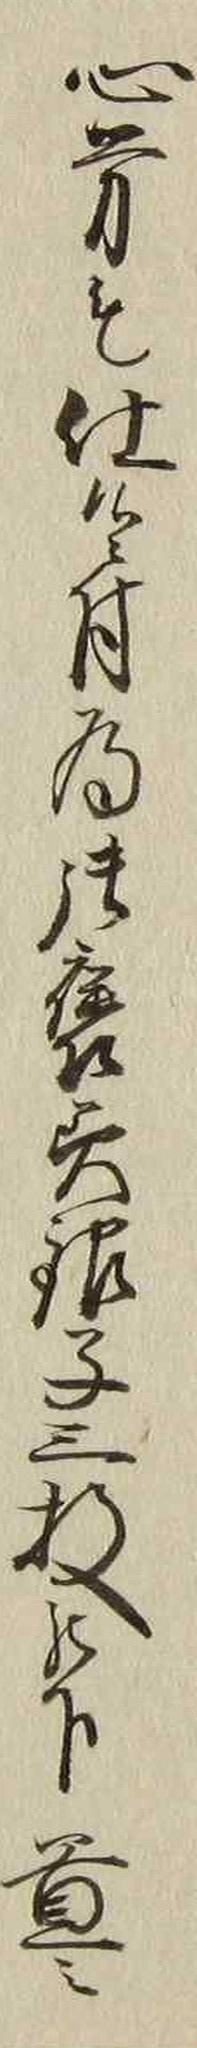心労も仕候に付為御褒美銀子三枚被下置之
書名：諸士系譜　巻之67　を之部1
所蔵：会津若松市立会津図書館
